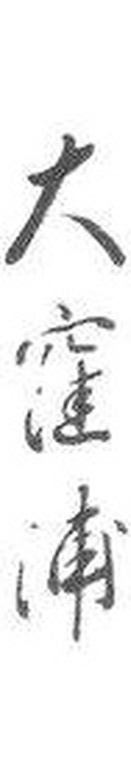大窪浦
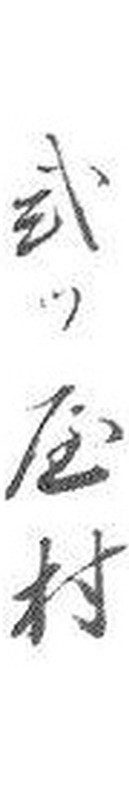弐ツ屋村
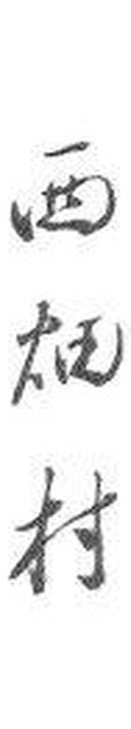西畑村
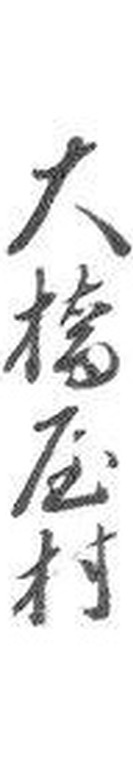大橋屋村
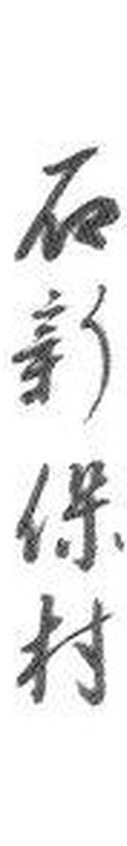石新保村
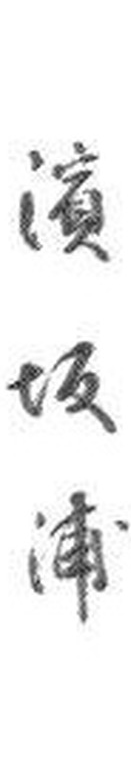濱坂浦
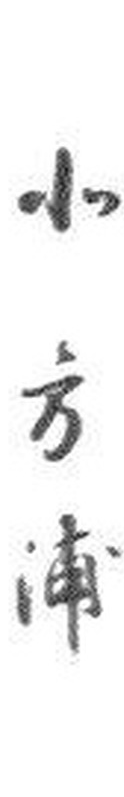北方浦
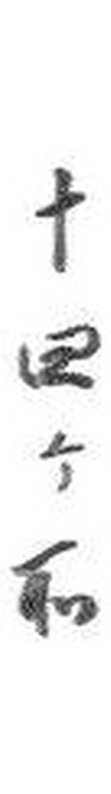十四ケ所
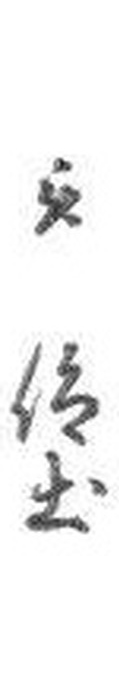被仰出
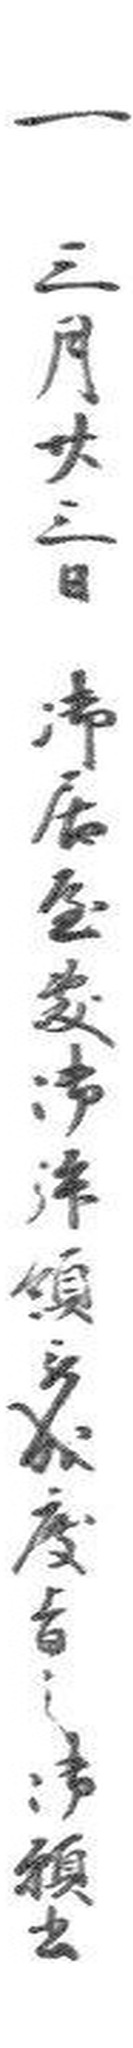一三月廿三日御居屋敷御拝領被成度旨之御願書
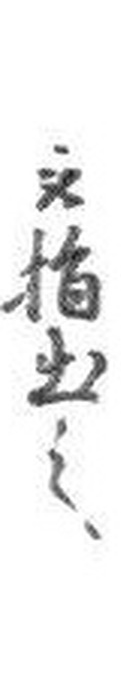被指出之

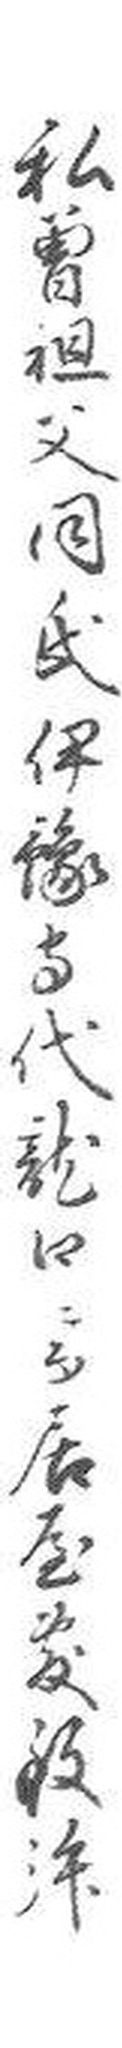私曾祖父同氏伊予守代龍口ニ而居屋敷致拝
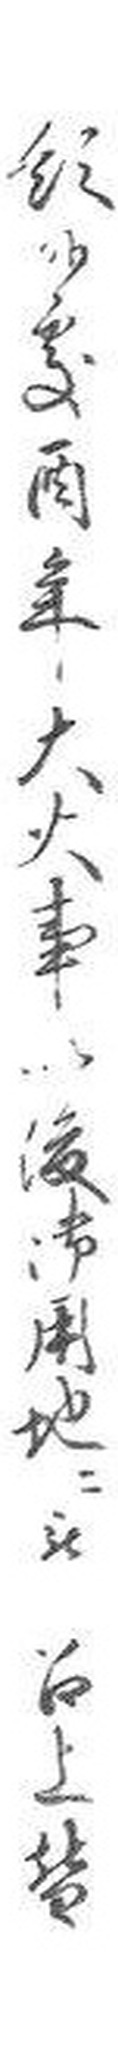領候処酉年大火事以後御用地ニ被召上替
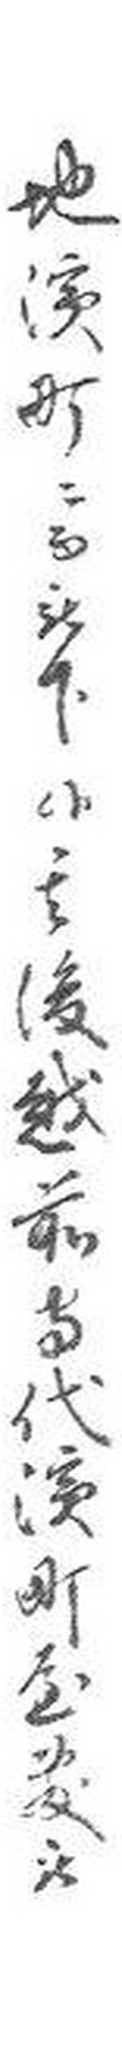地浜町ニ而被下候其後越前守代浜町屋敷被
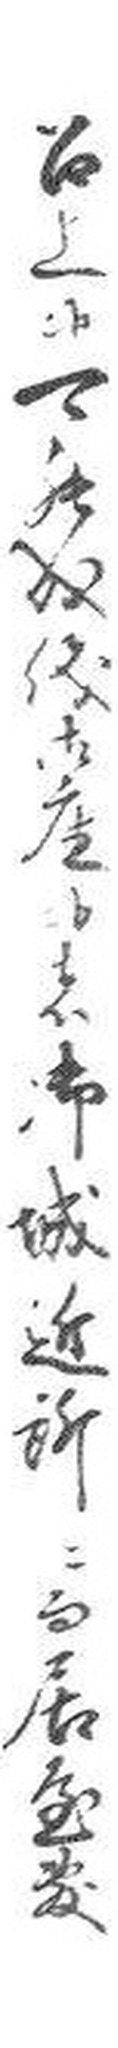召上候可罷成儀御座候者御城近所ニ而居屋敷
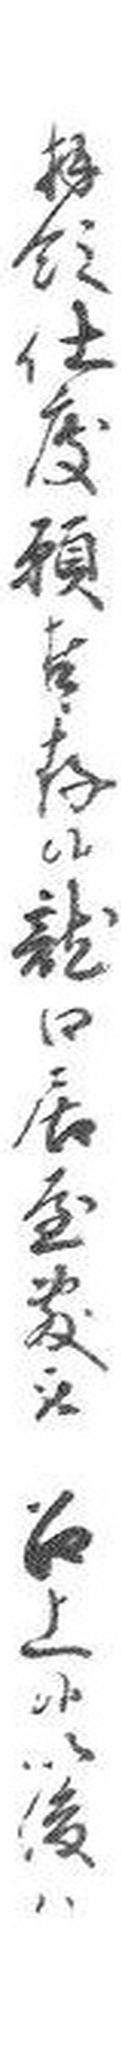拝領仕度願奉存候龍口居屋敷被召上候以後ハ
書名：家譜 二十九 吉邦公 従正徳二年到正徳三年
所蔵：福井県文書館 Fukui Prefectural Archives
